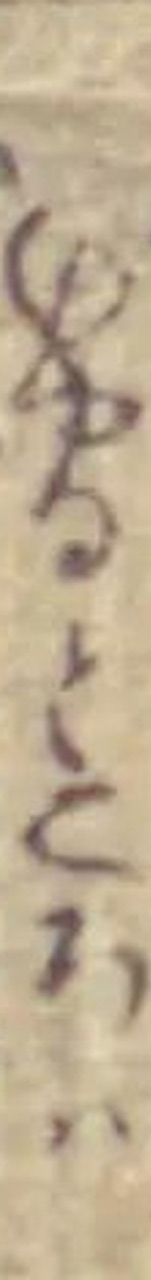いるところは
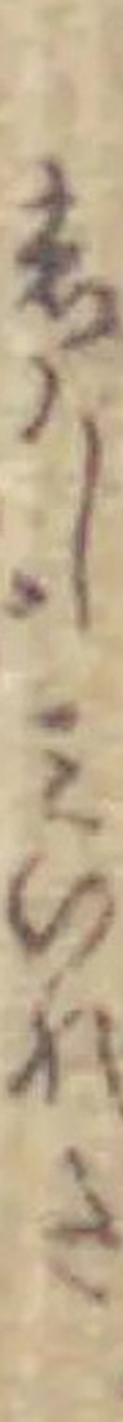しかしみいれた
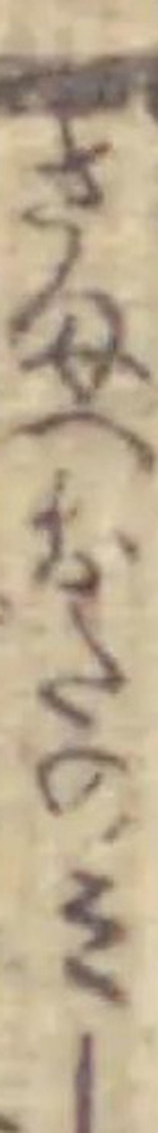さまへおたのみ
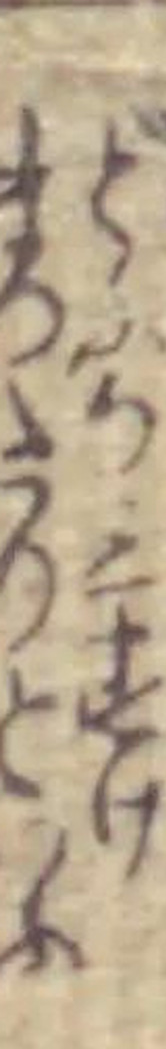まつたりといふ
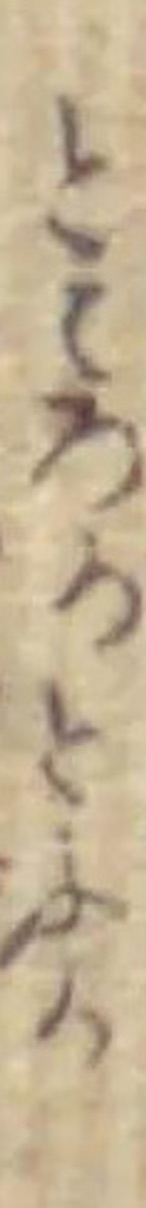ところがとふか
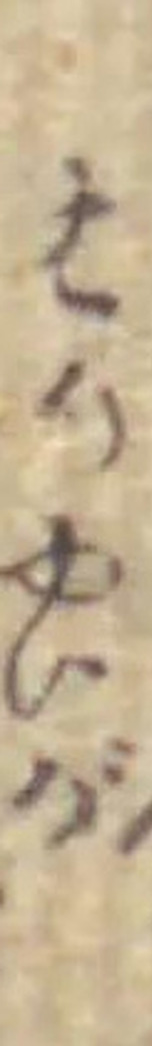はりやいが
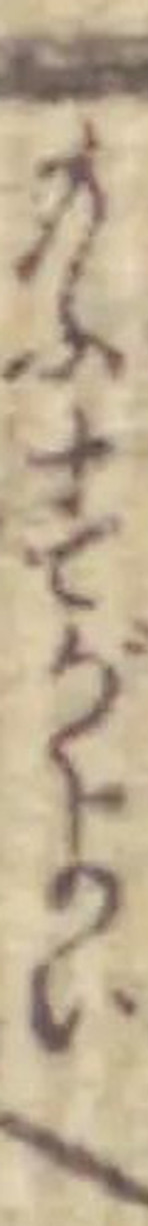もふすがよい
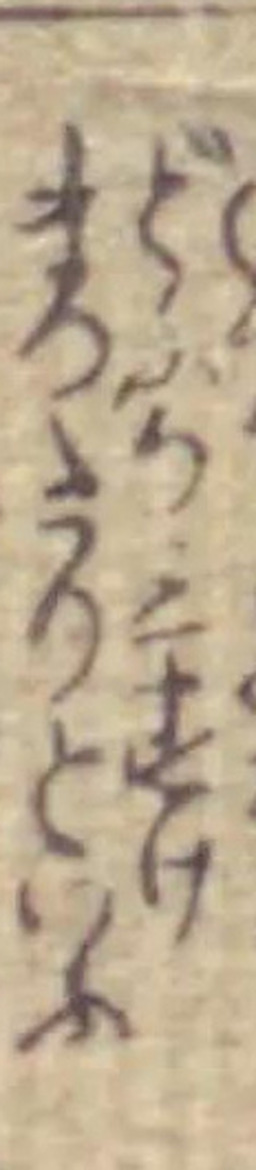まつたりといふ
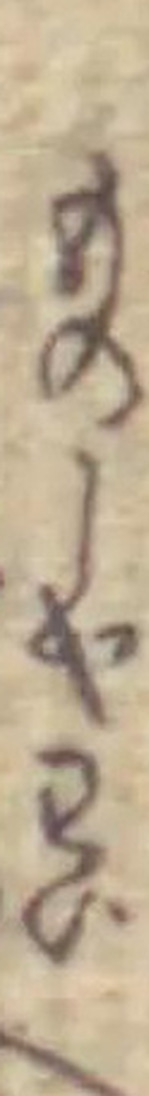ものしやわい
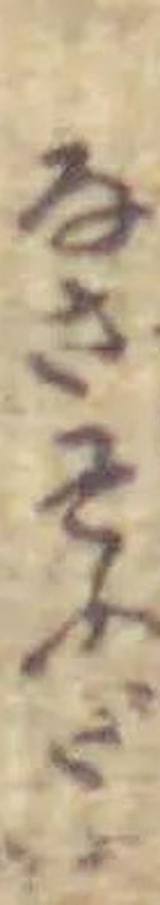なさそふだ
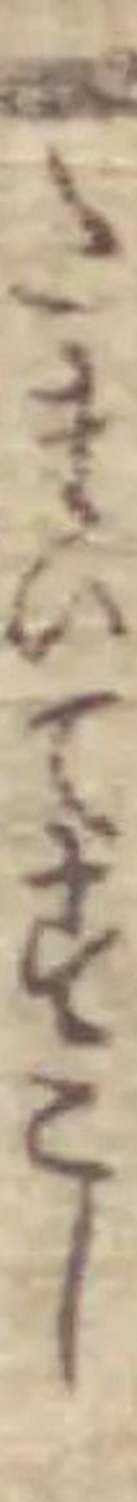たまいてすこし
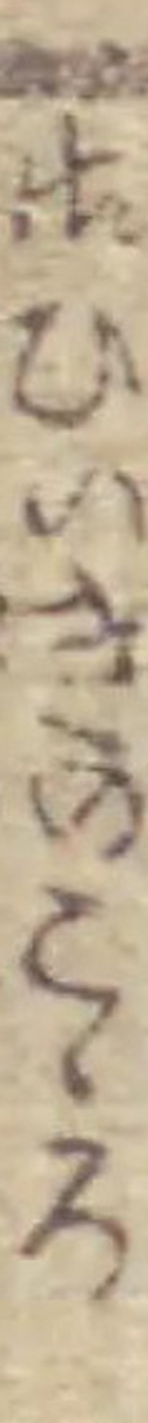御ひいきのこゝろ
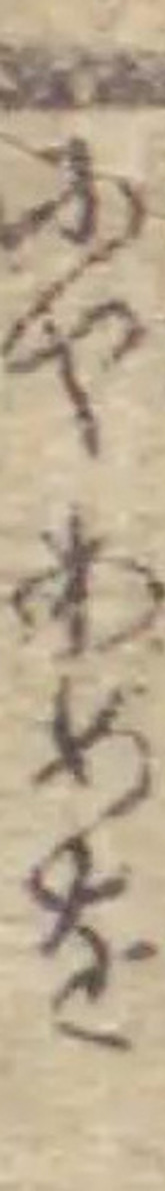にやあめを
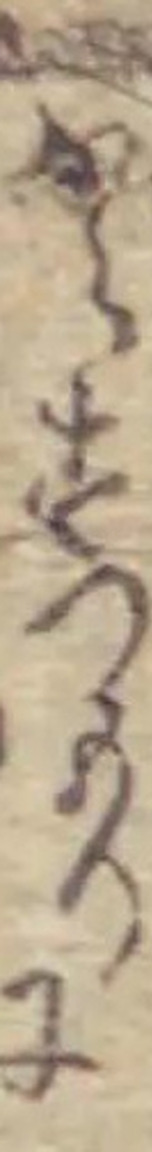ふらすつもりに
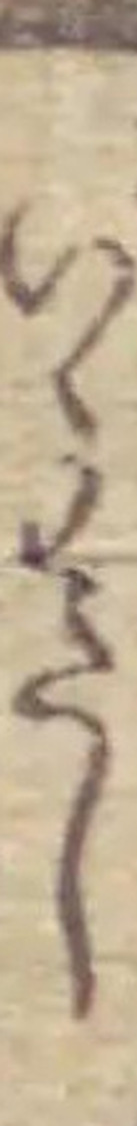いゝわたし
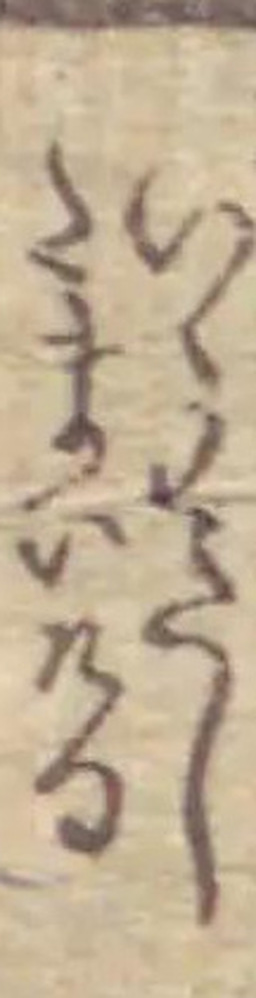たまいける
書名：雨宮風宮出儘略縁記 3巻
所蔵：国立国会図書館 National Diet Library, JAPAN
